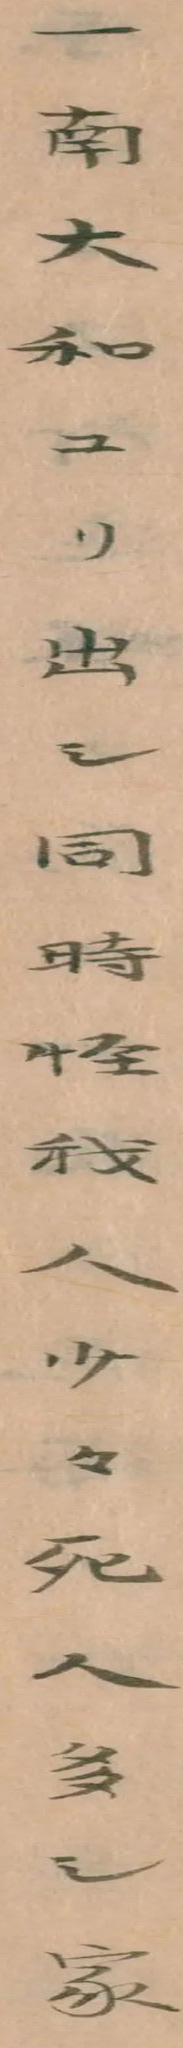一南大和ヨリ出シ同時怪我人少々死人少シ家
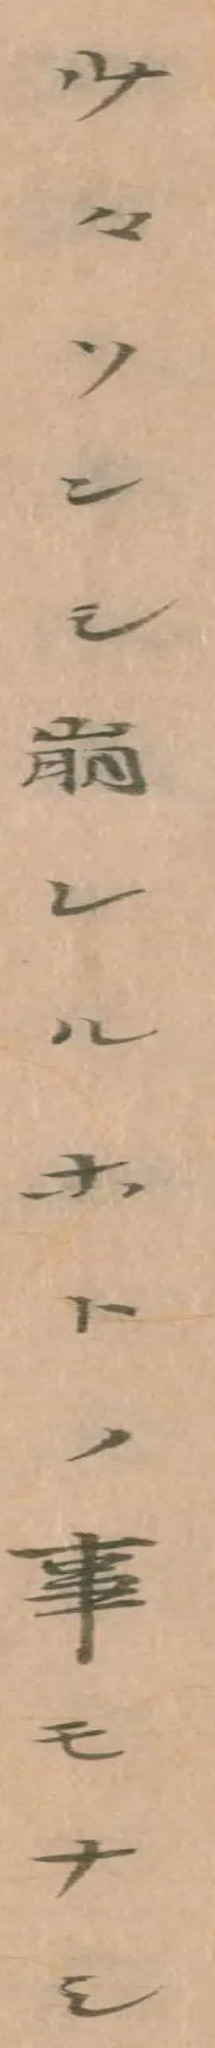少々ソンシ崩レルホトノ事モナシ
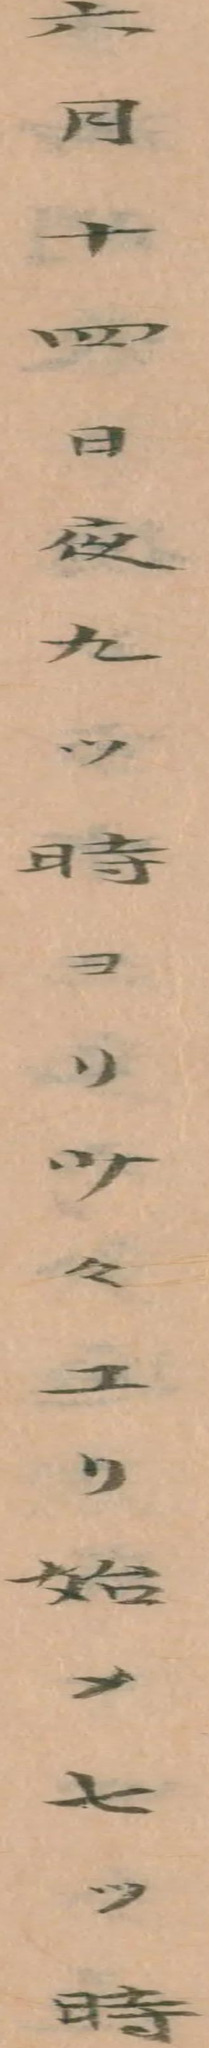六月十四日夜九ッ時ヨリ少々ユリ始メ七ッ時
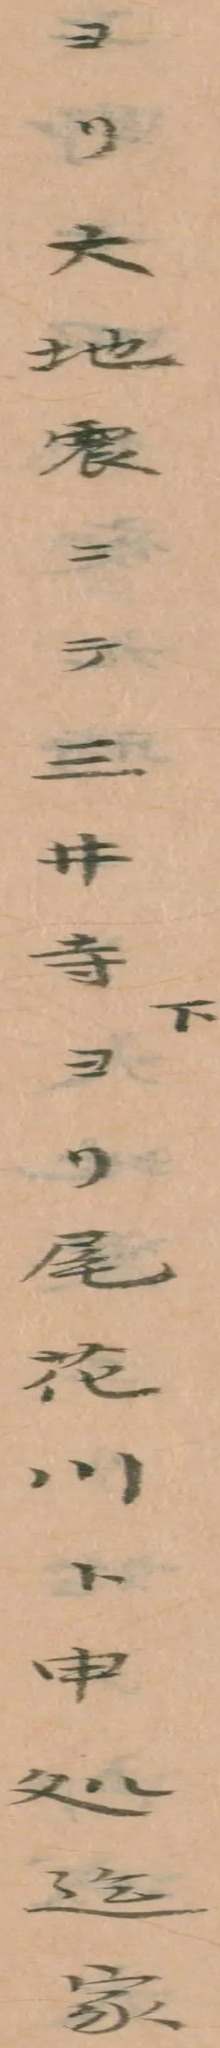ヨリ大地震ニテ三井寺下ヨリ尾花川ト申処迄家
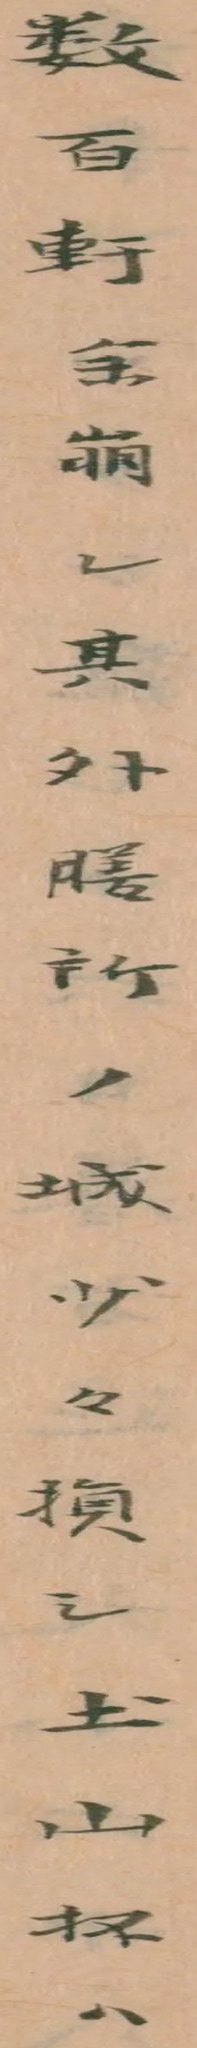数百軒余崩レ其外膳所ノ城少々損シ土山抔ハ
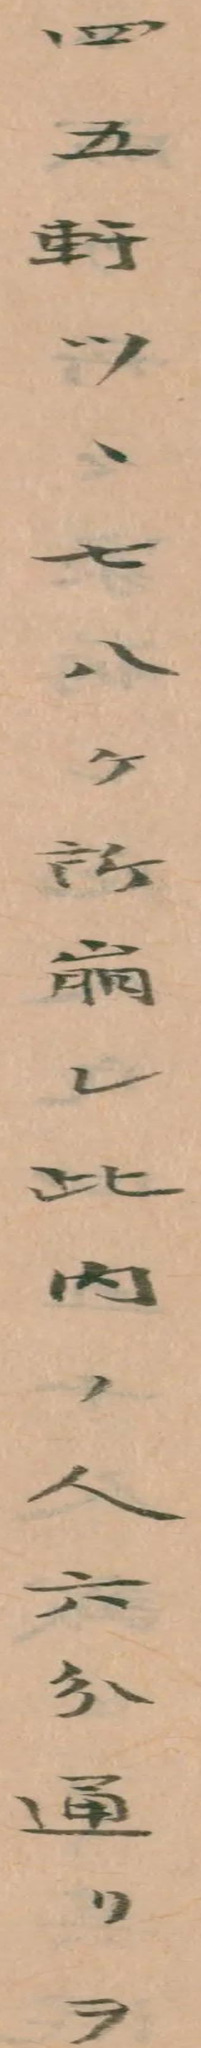四五軒ツヽ七八ヶ所崩レ此内ノ人六分通りヲ
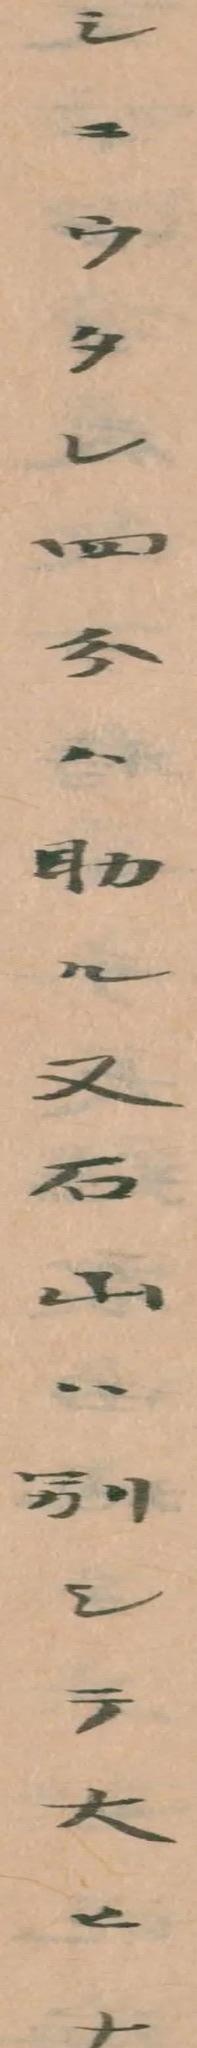シニウタレ四分ハ助ル又石山ハ別シテ大ヒナ
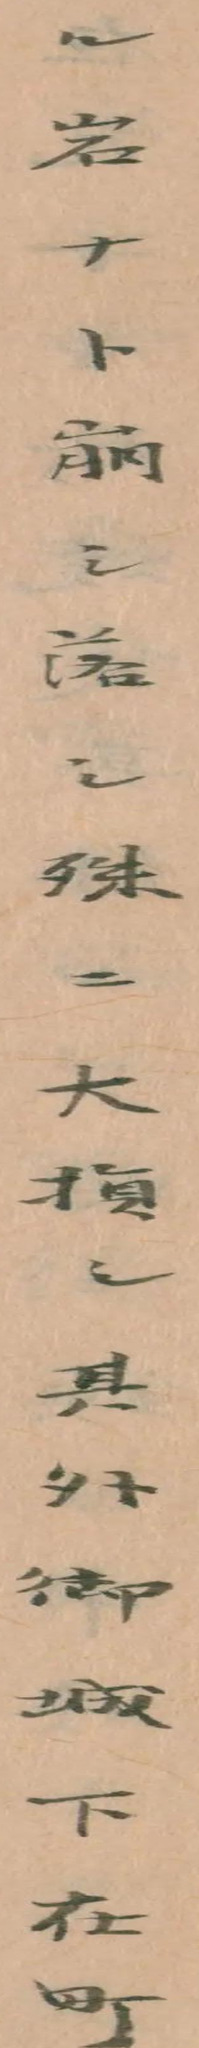ル岩ナト崩シ落シ殊ニ大損シ其外御城下在町
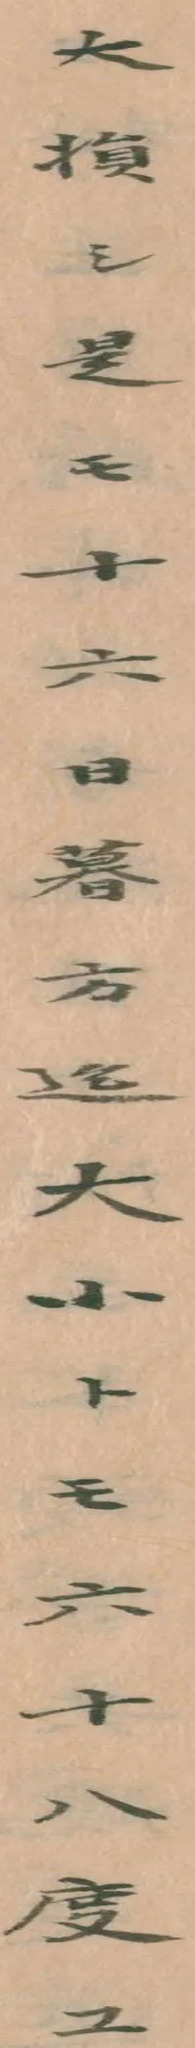大損シ是モ十六日暮方迄大小トモ六十八度ユ
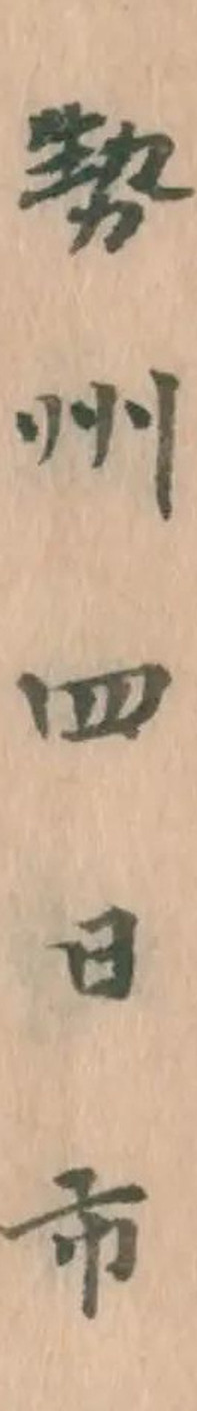勢州四日市
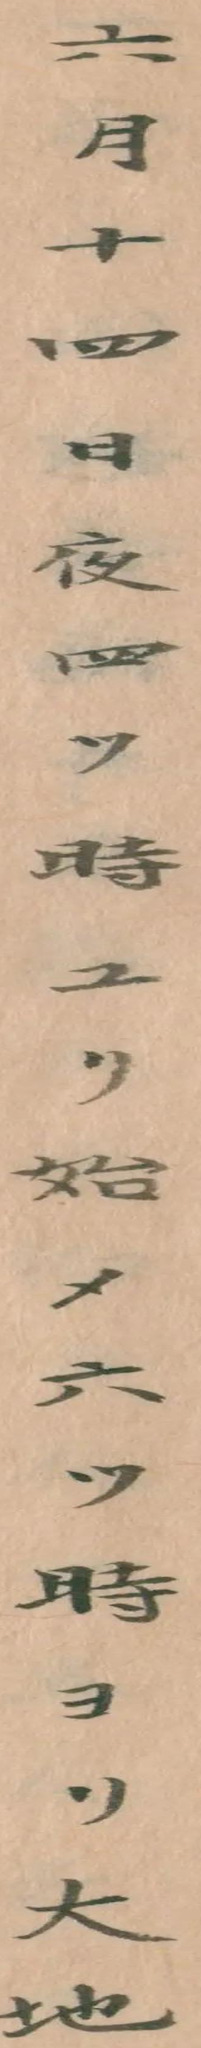六月十四日夜四ッ時ユリ始メ六ッ時より大地
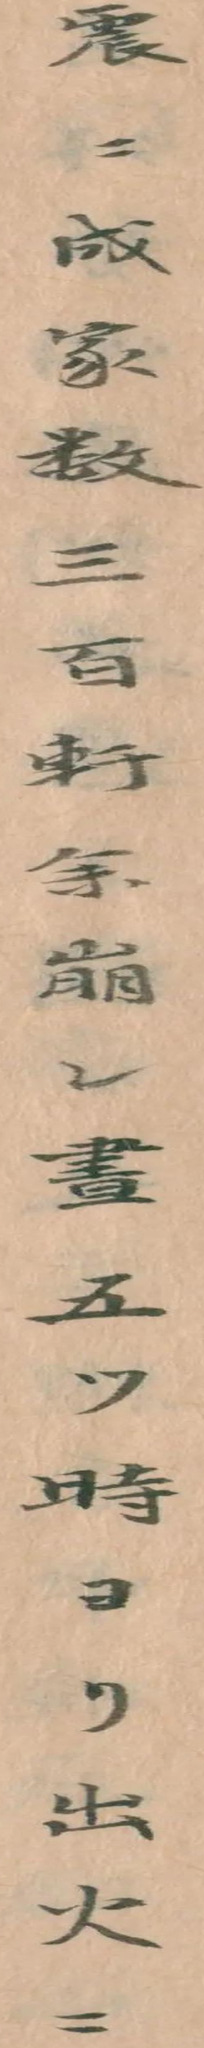震ニ成家数三百軒余崩レ晝五ツ時ヨリ出火ニ
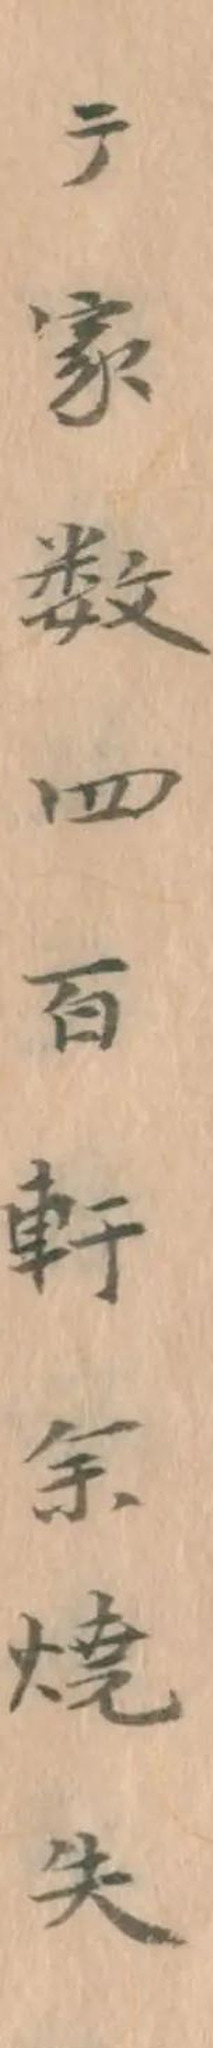テ家数四百軒余焼失

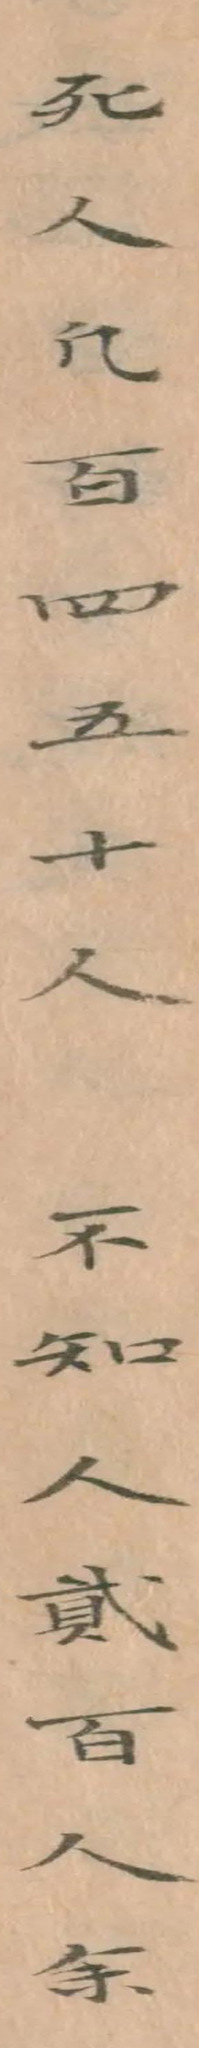死人凡百四五十人不知人弐百人余
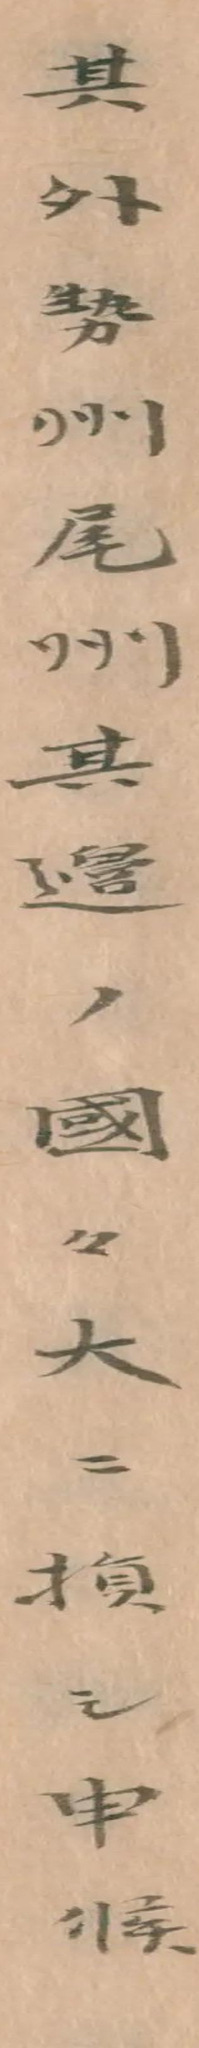其外勢州尾州其辺ノ国々大ニ損シ申候
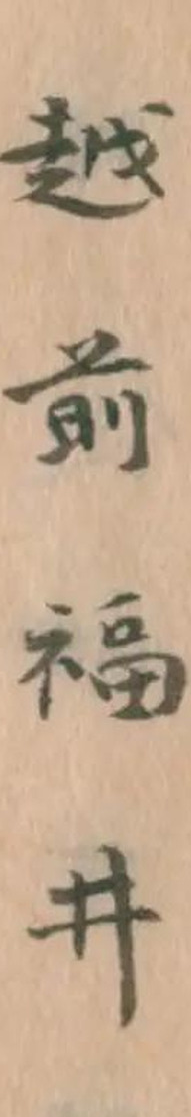越前福井
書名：地災撮要. 巻1(噴火山・地震ノ部)
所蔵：国立国会図書館 National Diet Library, JAPAN
